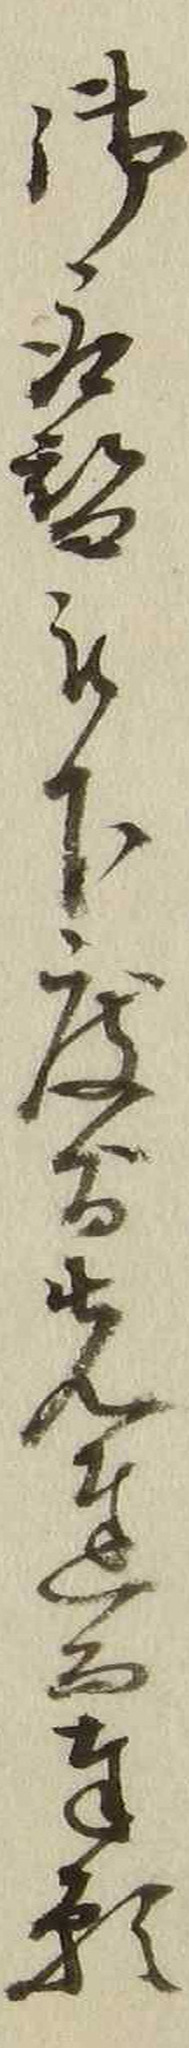御取替被下度旨先達而奉願
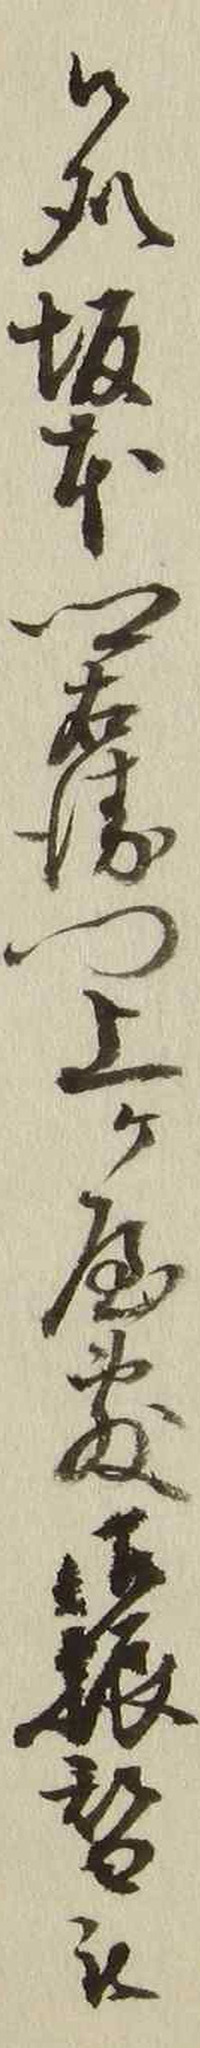候処坂本郷右衛門上ケ屋敷御振替被
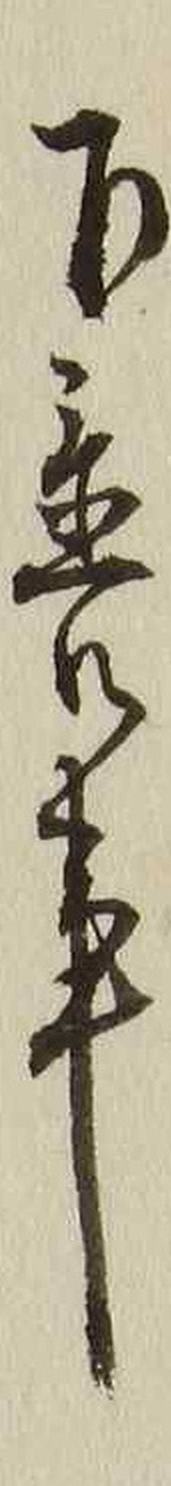下置候事
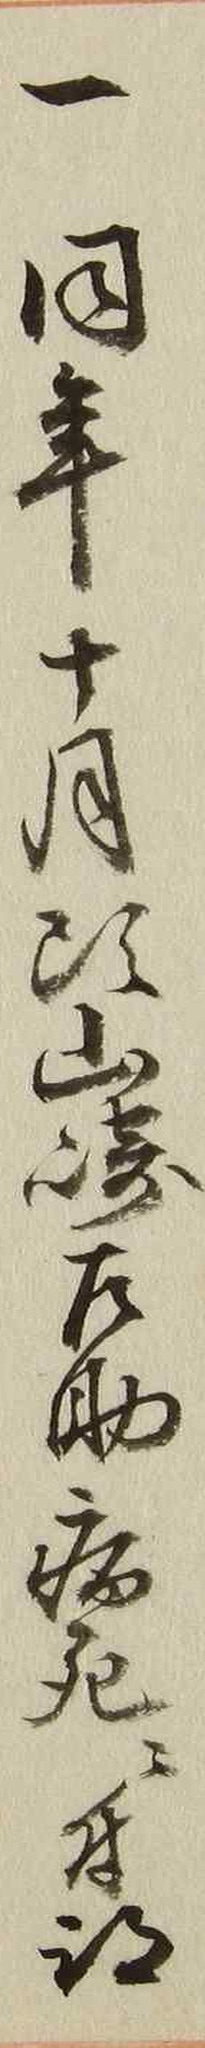一同年十月頭山崎左助病死ニ付跡
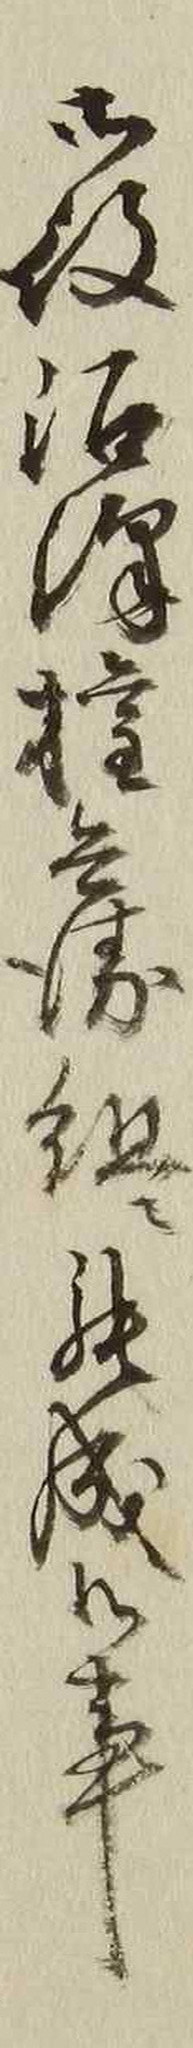御役沼沢権兵衛組ニ罷成候事
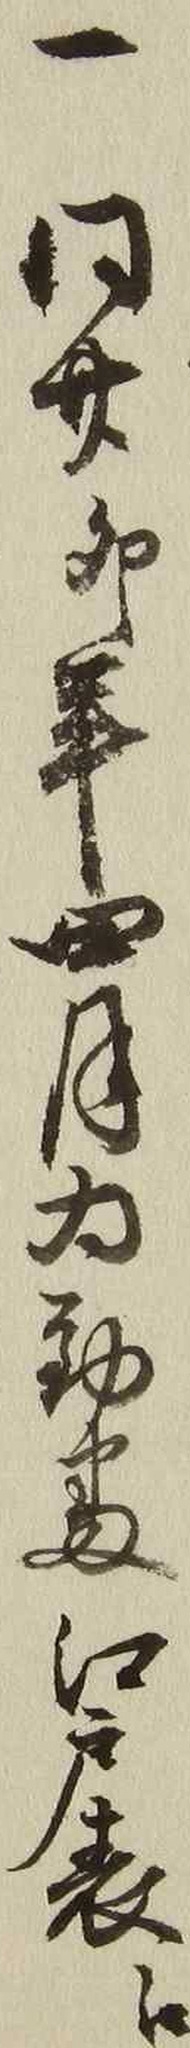一同廿卯年四月為勤番江戸表江
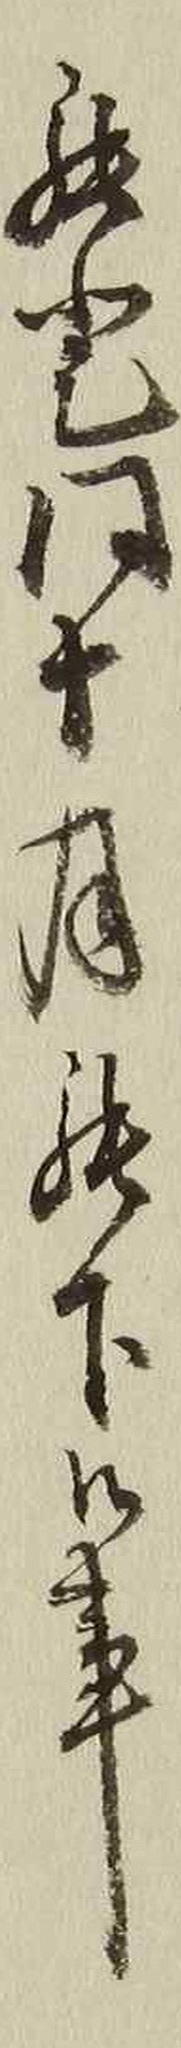罷登同十月罷下候事
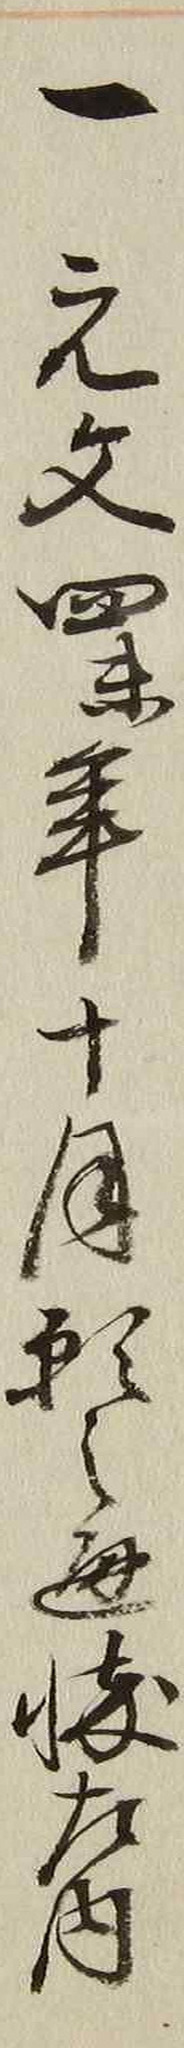一元文四未年十月願之通悴左内
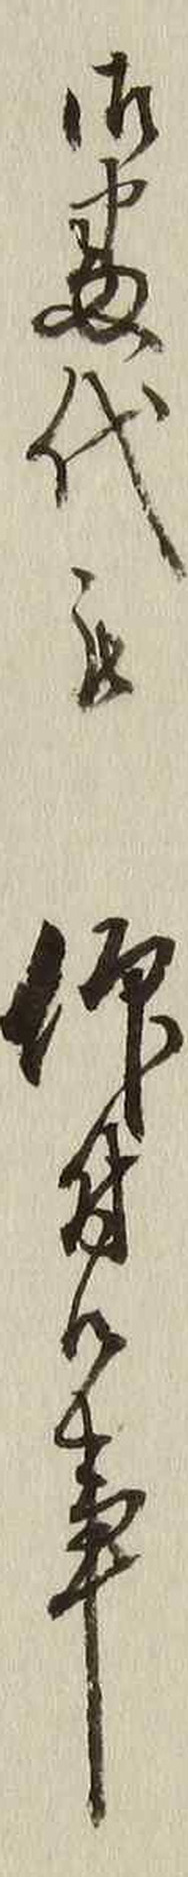御番代被仰付候事
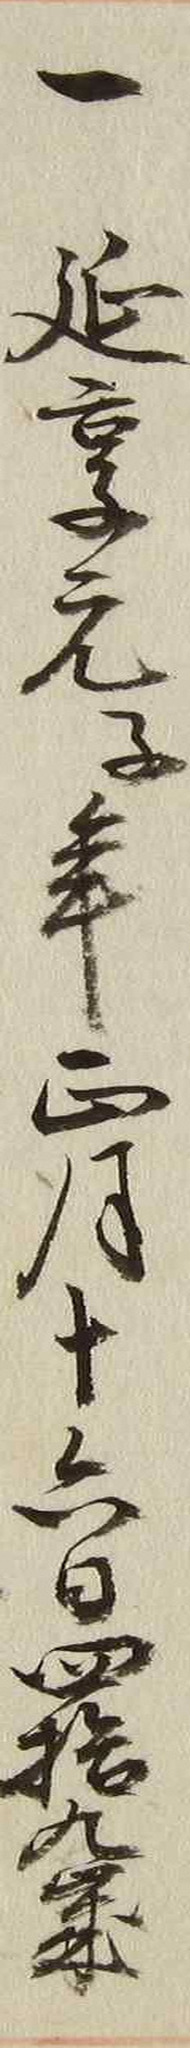一延享元子年正月十六日四拾九歳
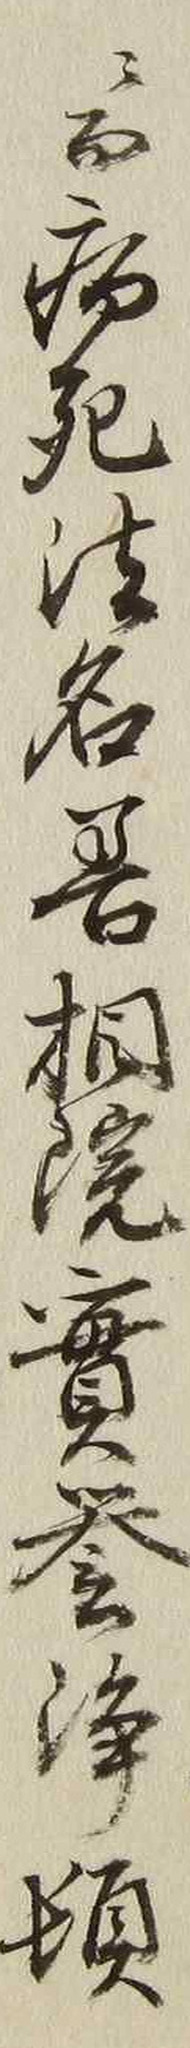ニ而病死法名善相院実誉浄頓
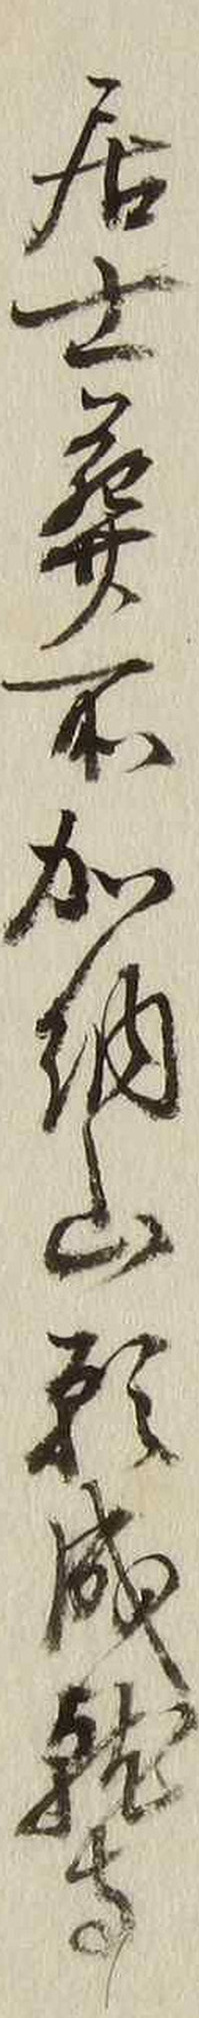居士葬所加納山願成就寺
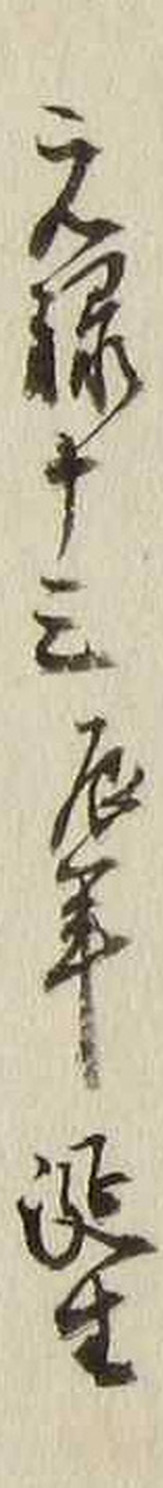元禄十三辰年誕生
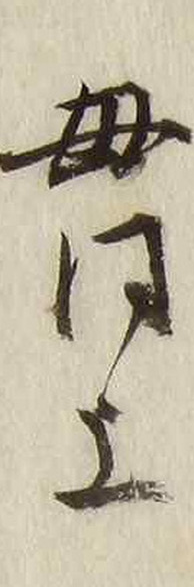母同上

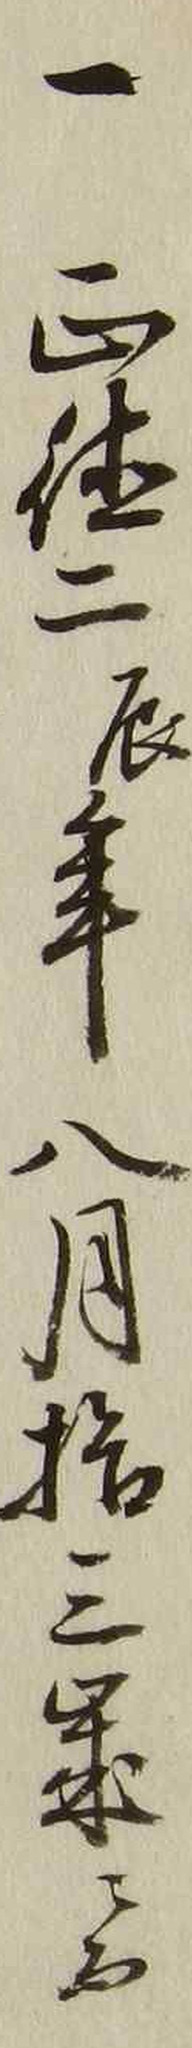一正徳二辰年八月拾三歳ニ而
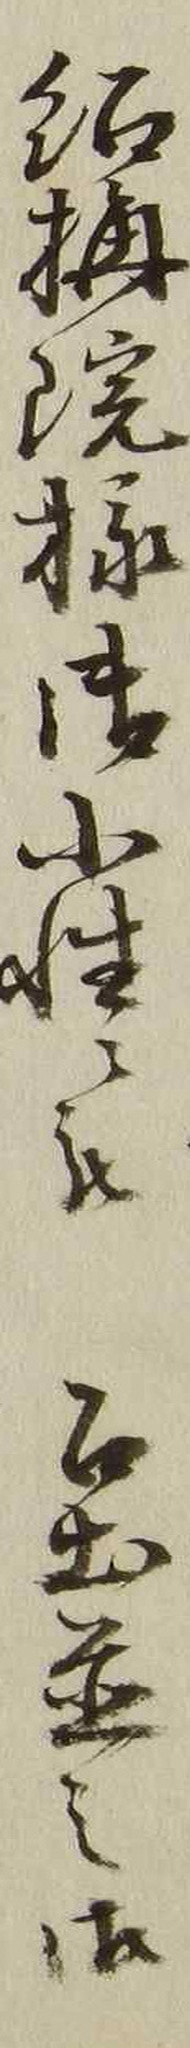紹栴院様御小性ニ被召出並之御
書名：諸士系譜　巻之23　い之部23
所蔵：会津若松市立会津図書館
